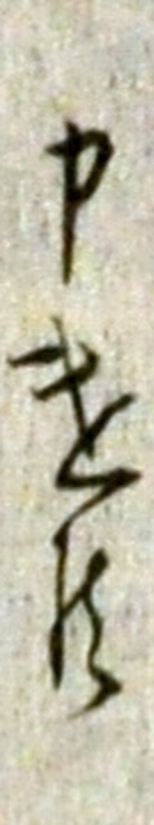申遣候
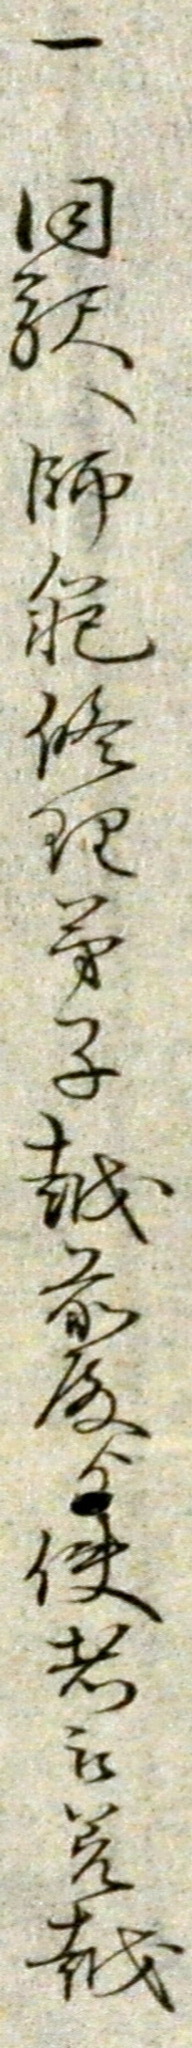一同駅へ師範修理弟子越前殿ゟ使者被差越
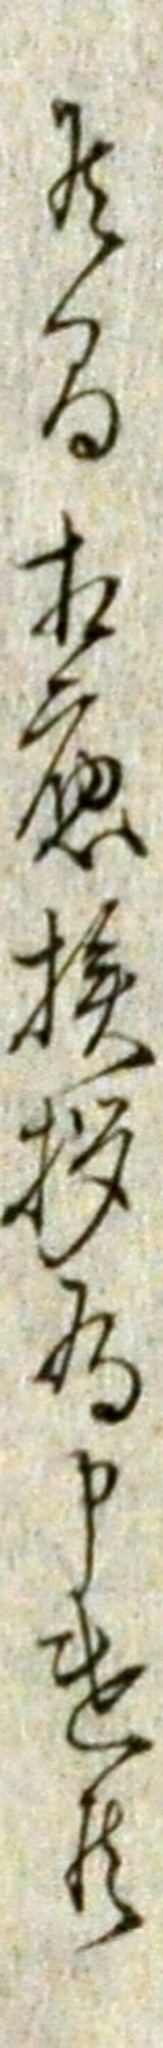候間相応挨拶為申遣候
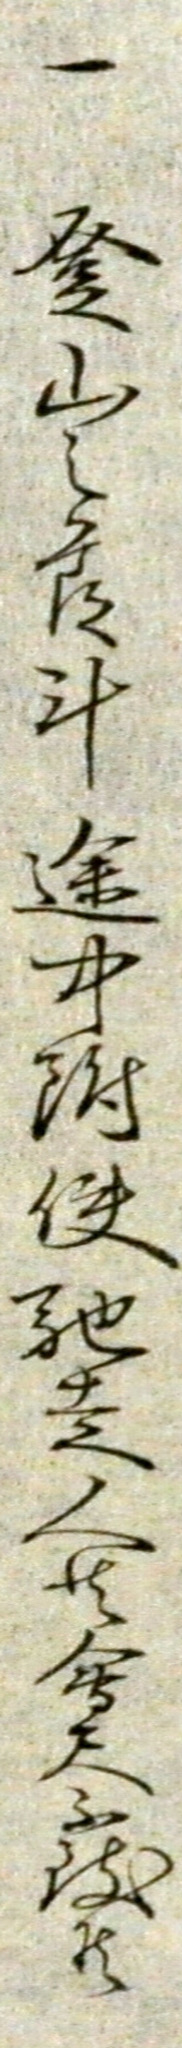一登山之節計途中附使馳走人共会尺不致候
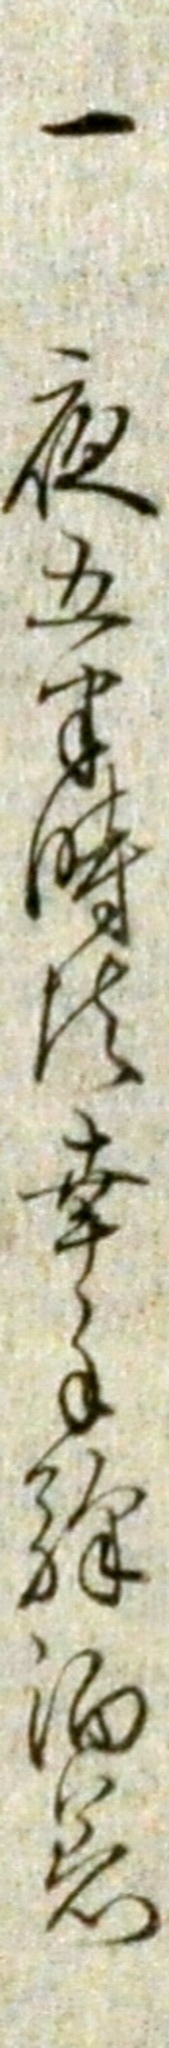一夜五半時頃幸手駅泊着
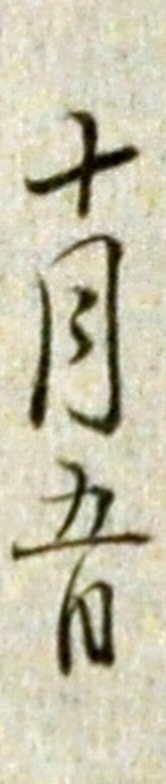十月五日
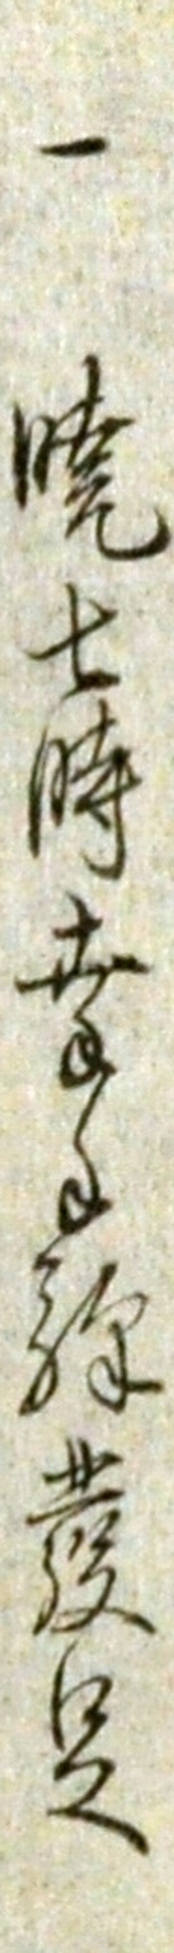一暁七時幸手駒発足

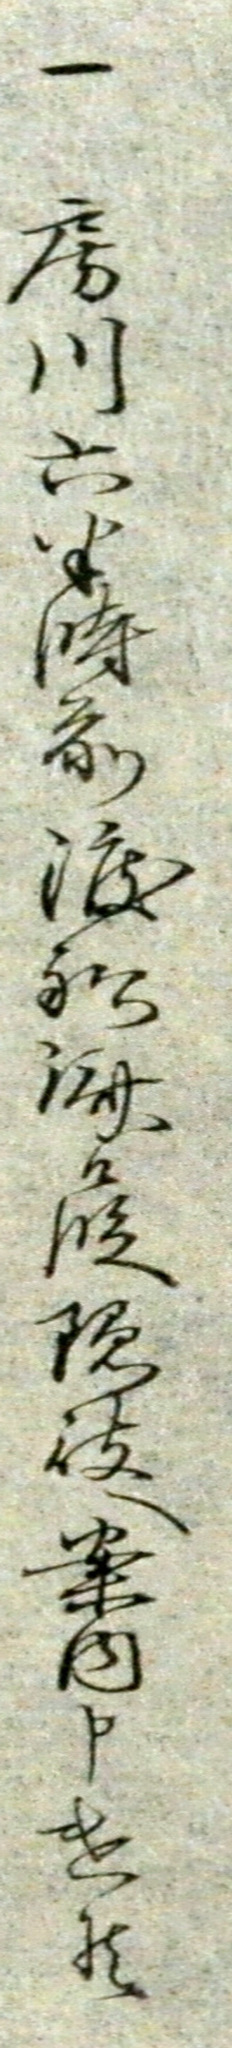一房川六半時前渡船済候段隠岐へ案内申遣候
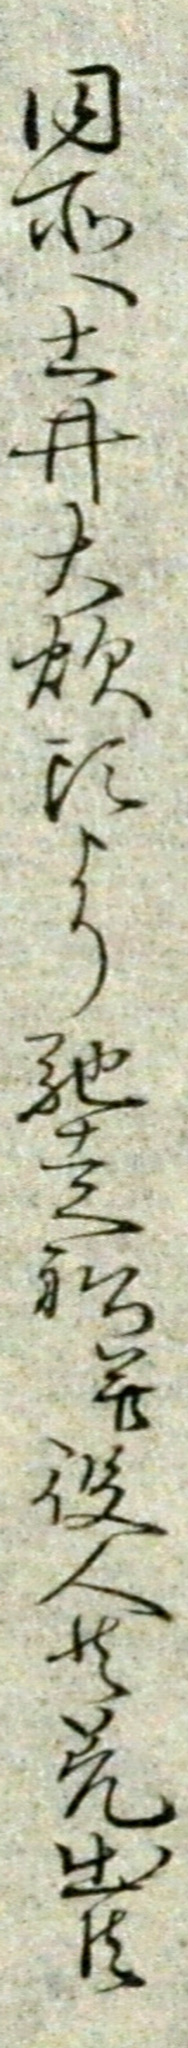同所へ土井大炊頭より馳走船幷役人共差出候
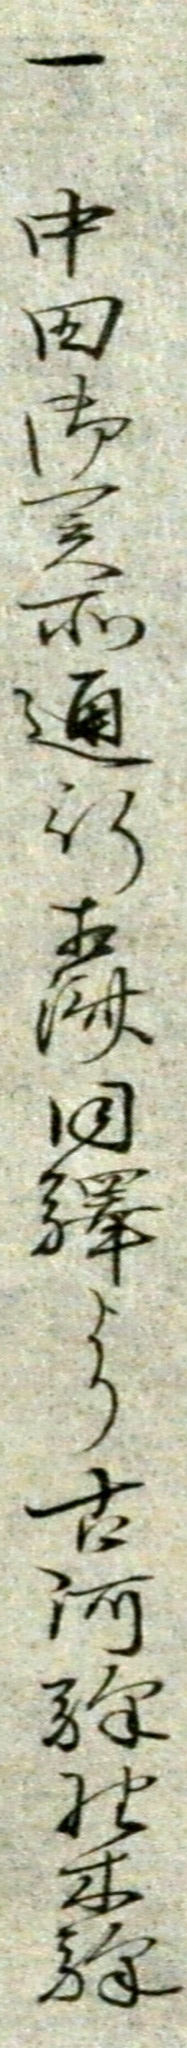一中田御関所通行相済同駅より古河駅野木駅
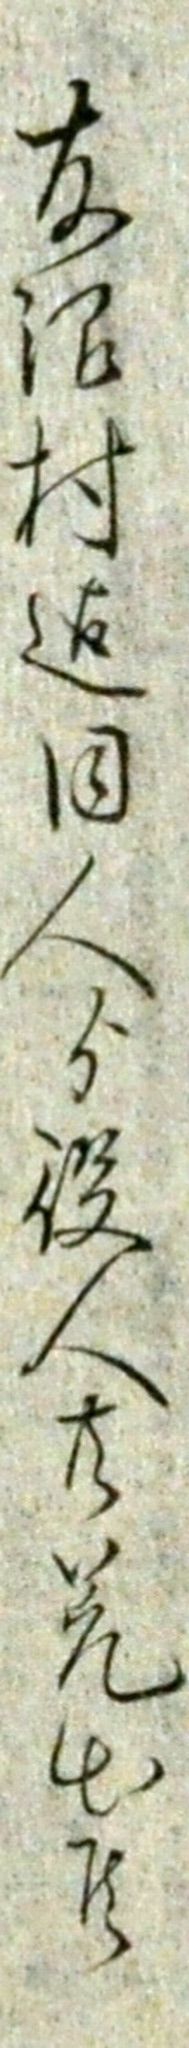友沼村迄同人ゟ役人共差出候
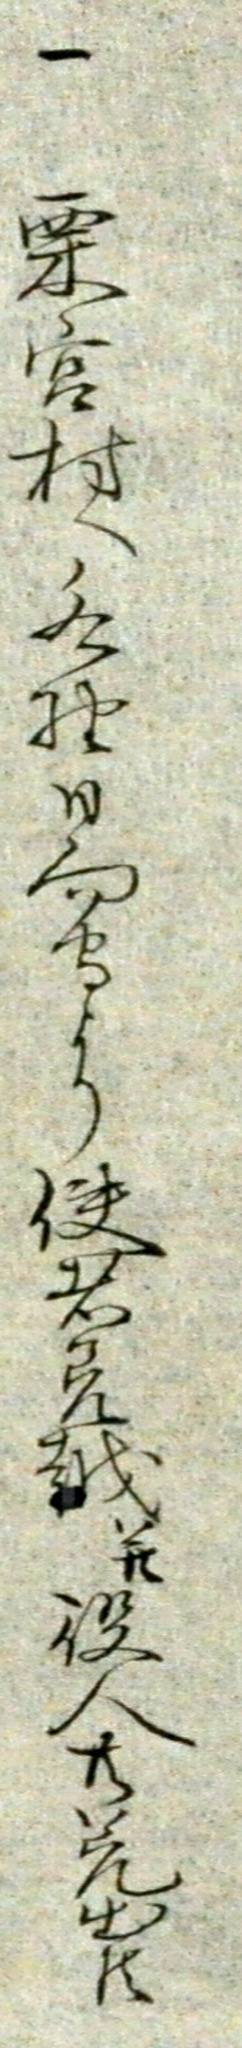一栗宮村へ水野日向守より使者差越并役人共差出候
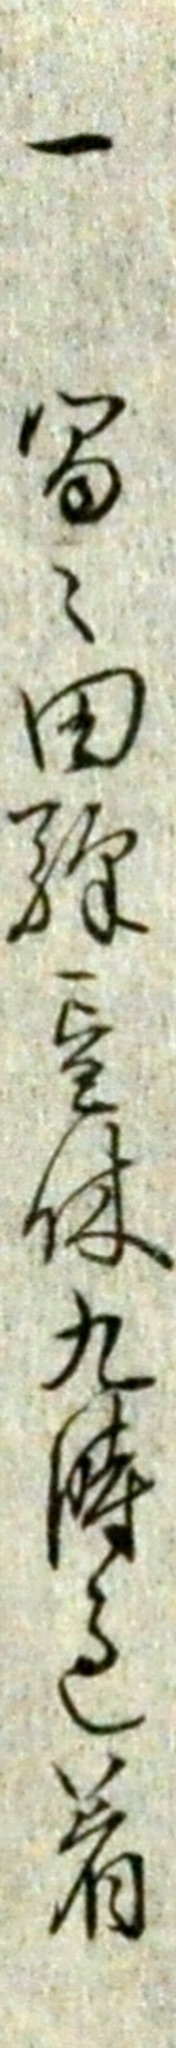一間々田駅昼休九時過着
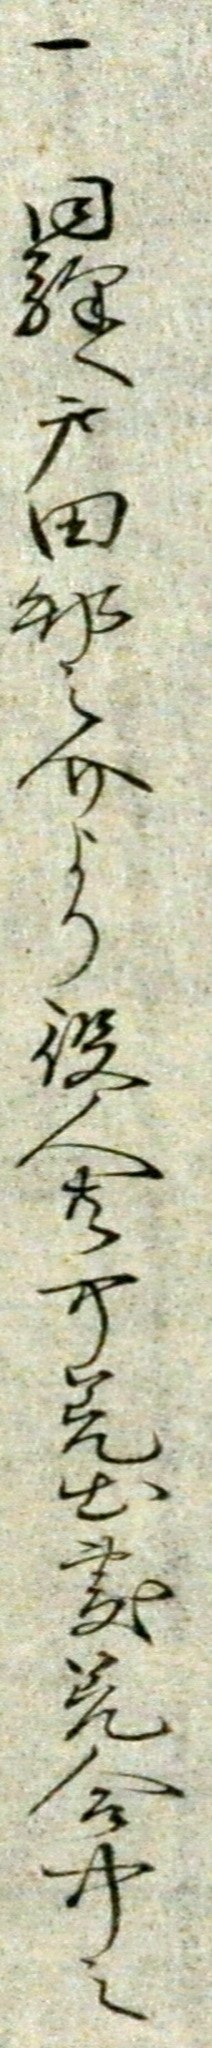一同駅へ戸田邦之介より役人共可差出処差合中之
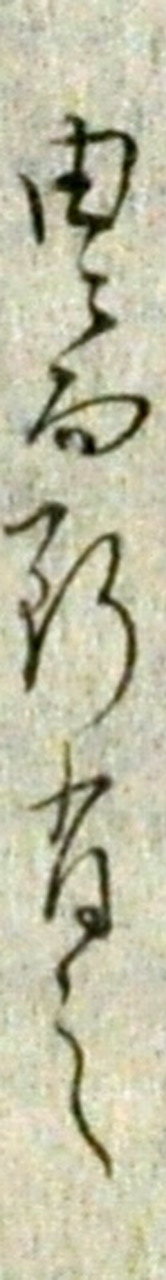由ニ而断有之
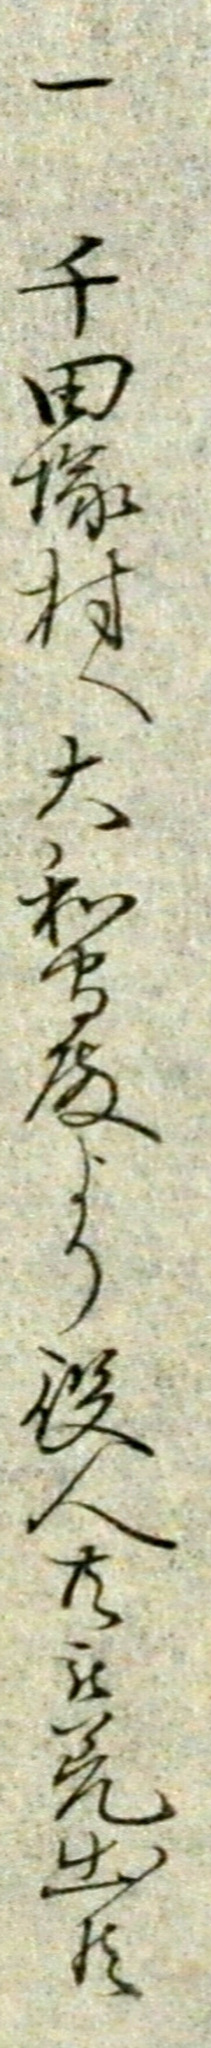一千田塚村へ大和守殿より役人共被差出候
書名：日光御名代相勤候節ノ留
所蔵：伊那市立高遠町図書館・合同会社AMANE
